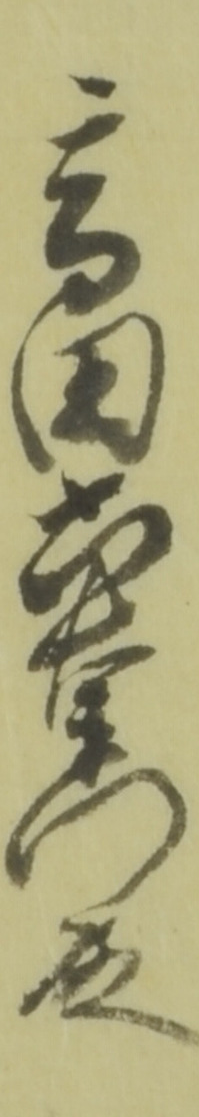高田六右衛門殿
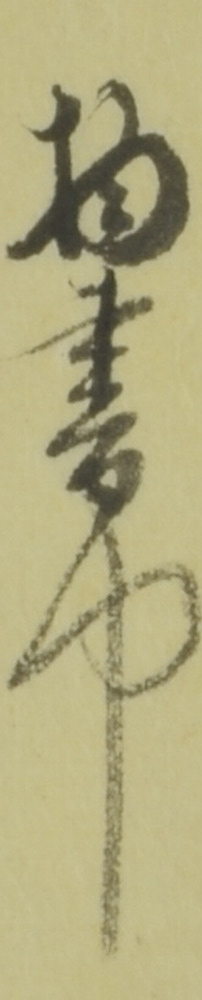物書中
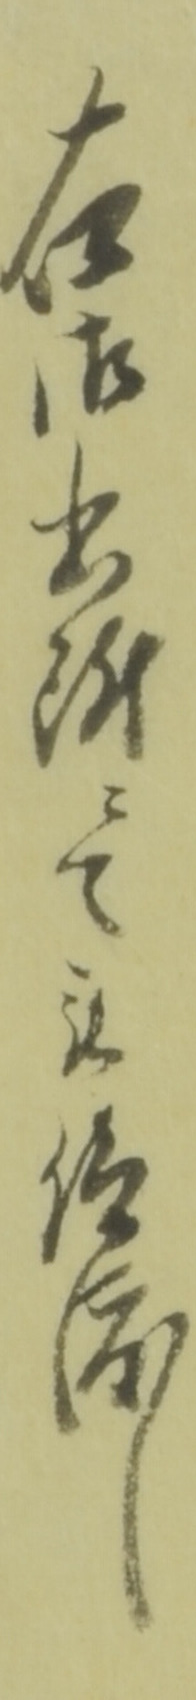右御書附ニて被仰渡候

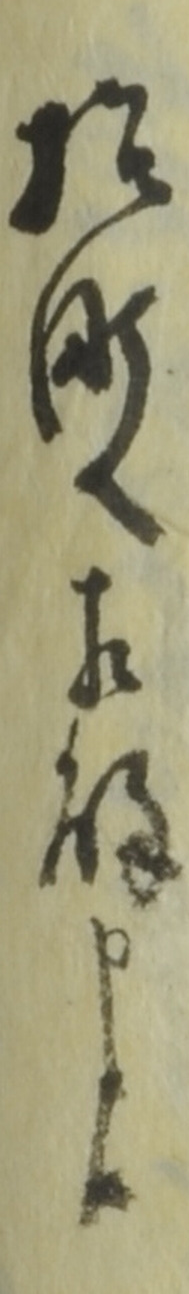於町へ相触申候
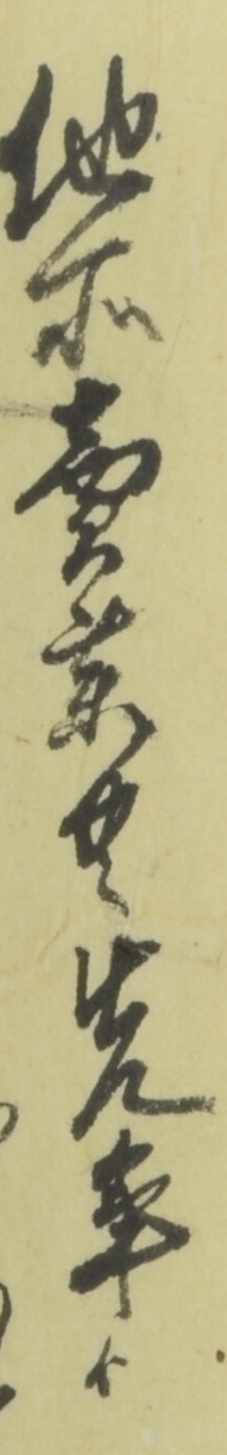他所売薬共先年ゟ
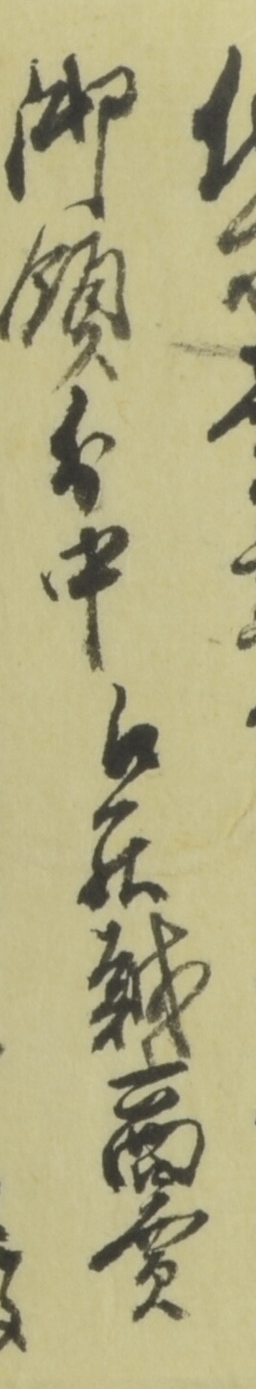御領分中江罷越商売
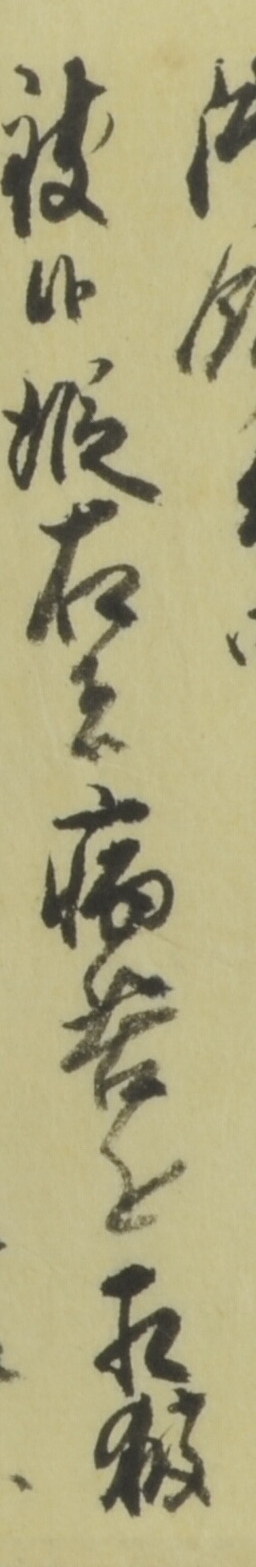致候段右は病苦を相救
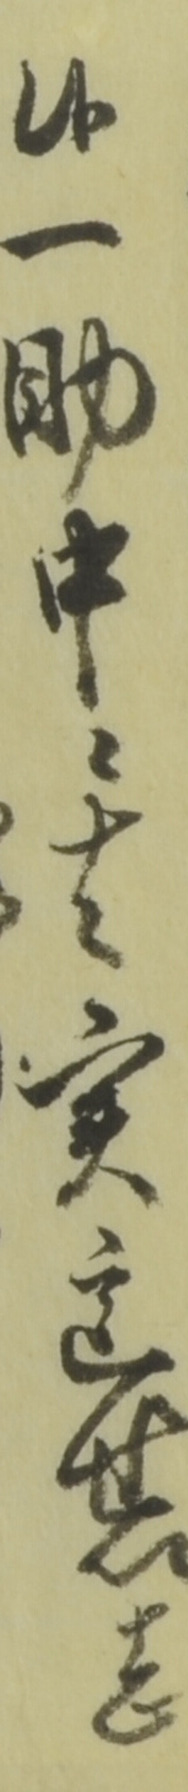候一筋中ニは実意せい志
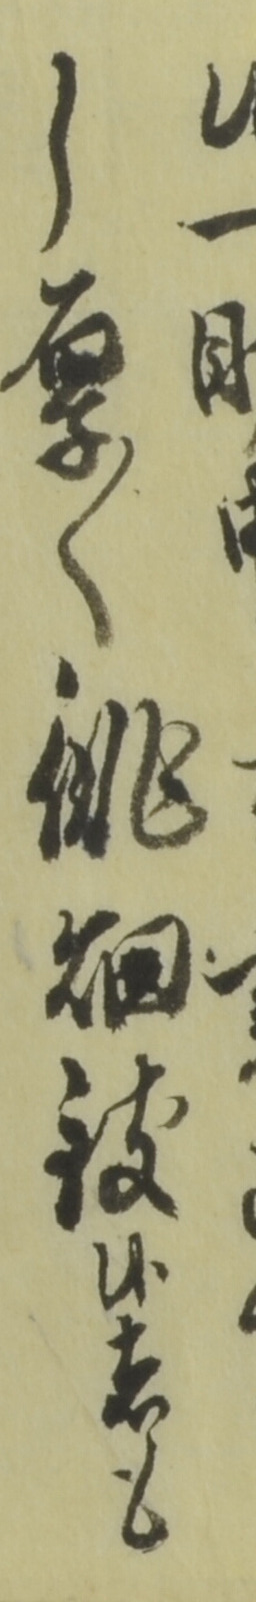し厚く徘徊致候者も
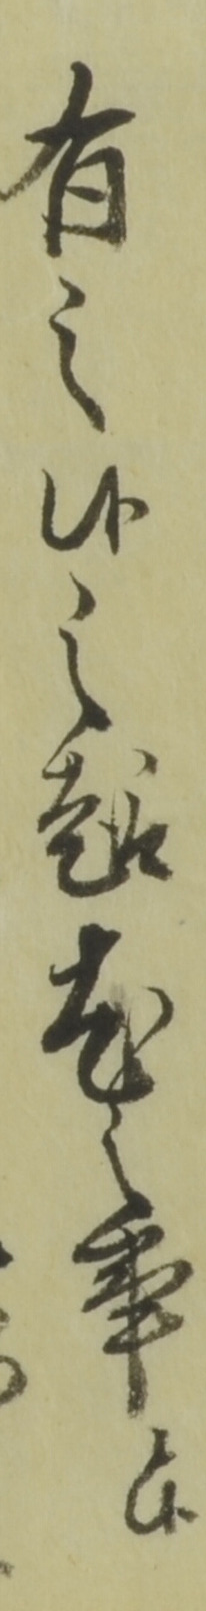有之候之趣尤之事ニ候
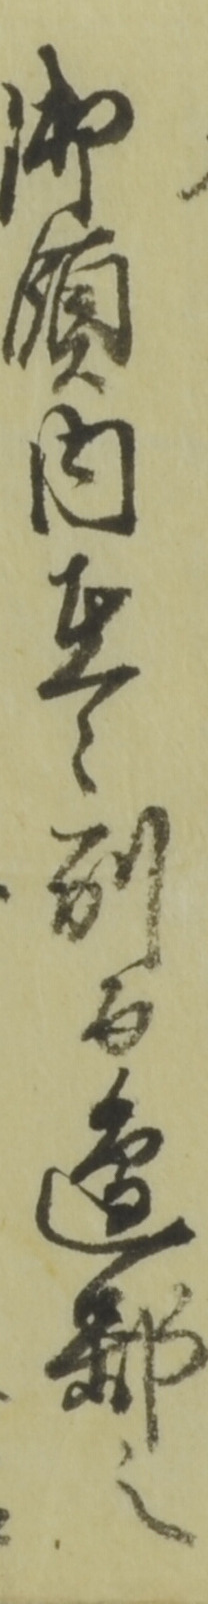御領内在々別而辺鄙之
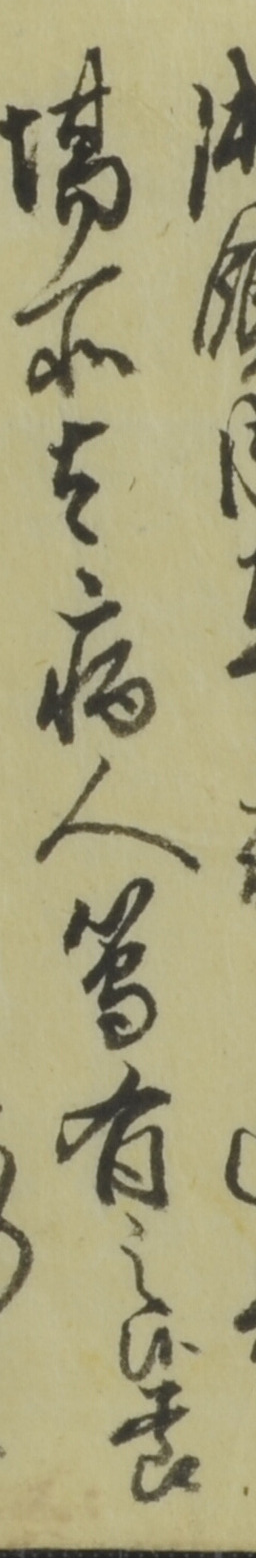場所は病人等有之候節
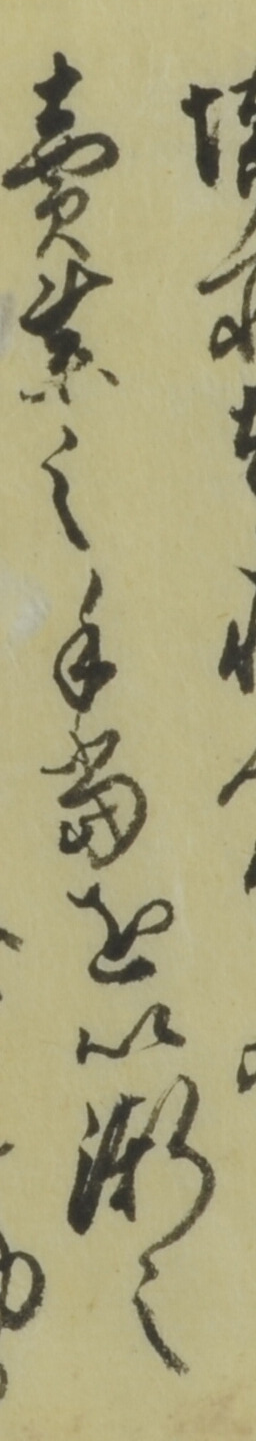売薬之手当を以漸々
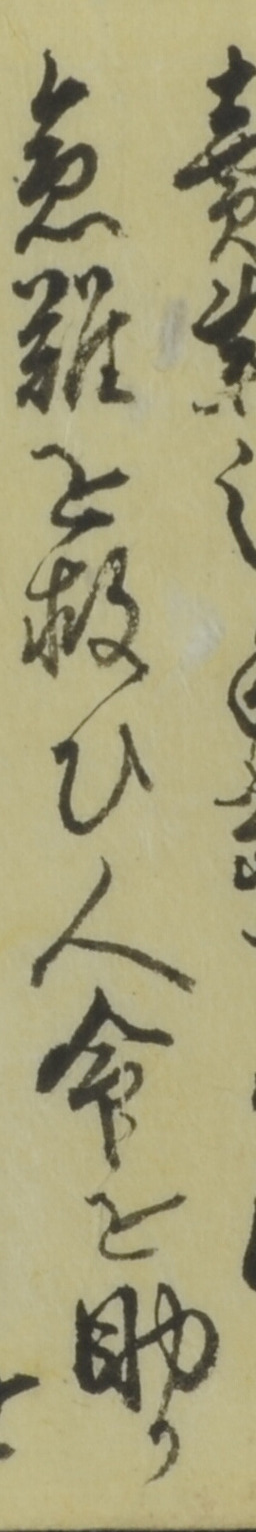急難を救ひ人命を助り
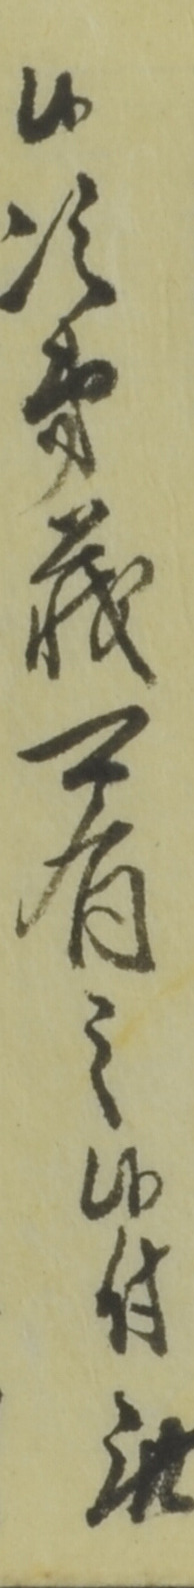候次第も可有之候付此
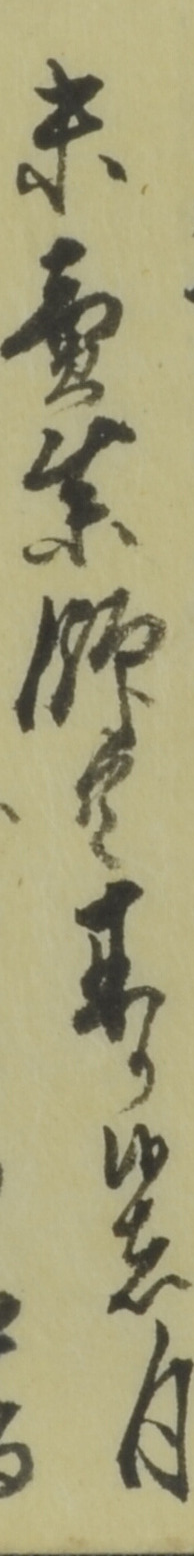未売薬師共来り候者自
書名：御触書御書附控
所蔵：伊那市立高遠町図書館・合同会社AMANE
